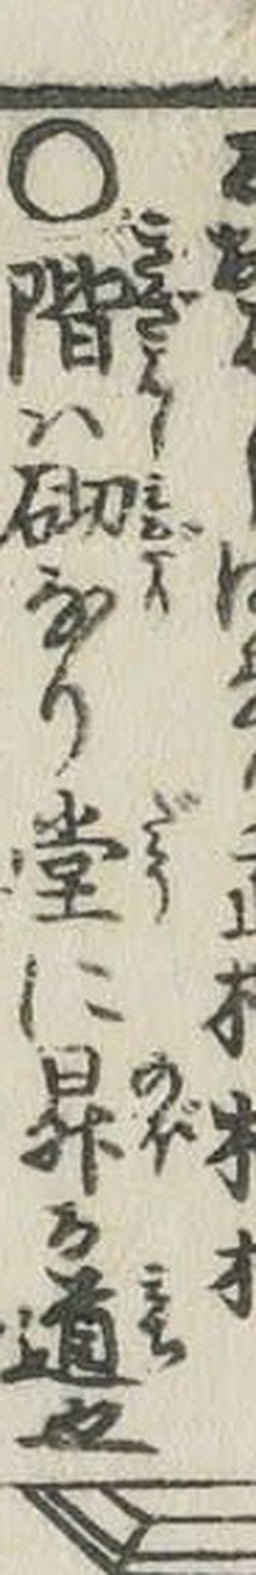○階は砌なり堂に昇る道也
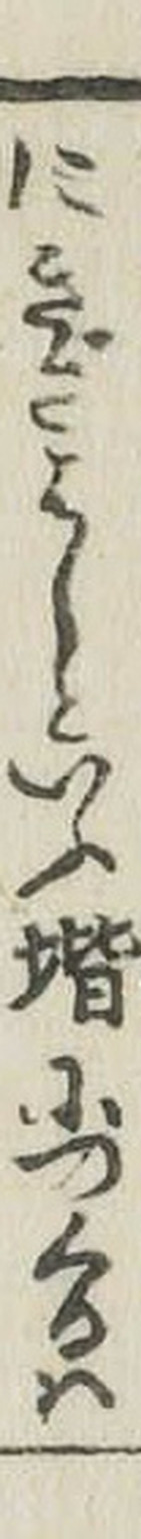にきざはしといふ堦につくるは
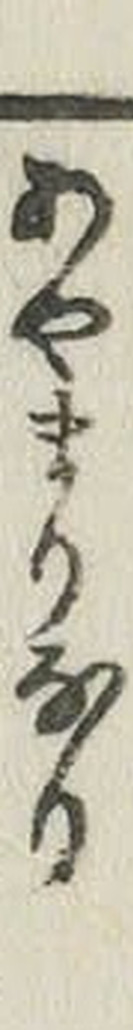あやまりなり
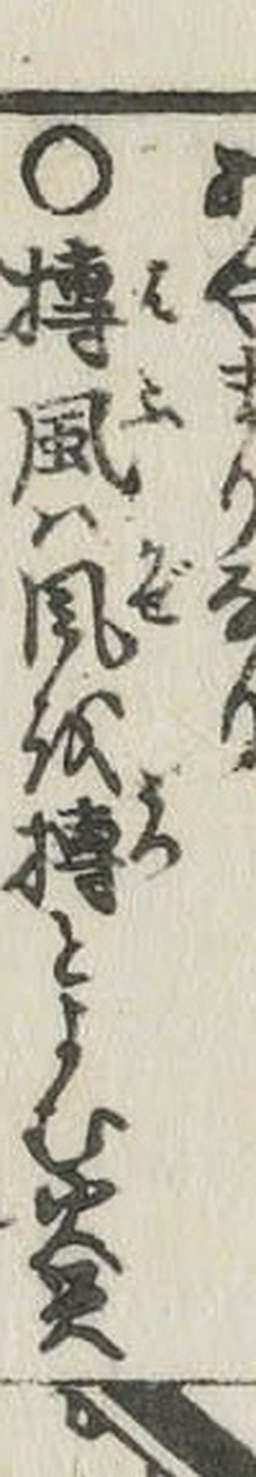○搏風は風を搏とよむ火災
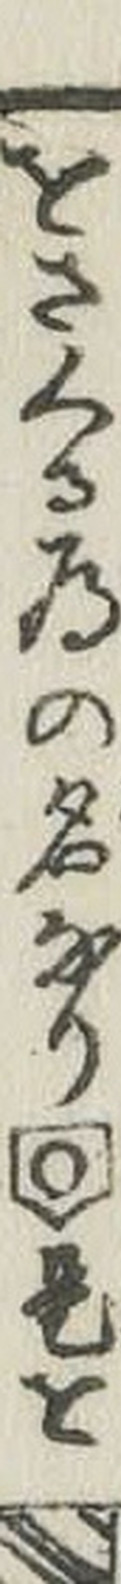をさくる為の名なり▢是を
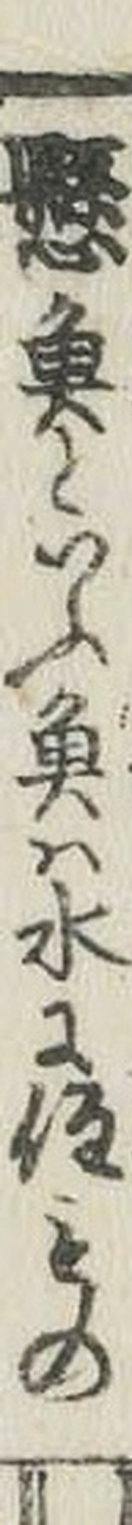懸魚といふ魚は水に住もの
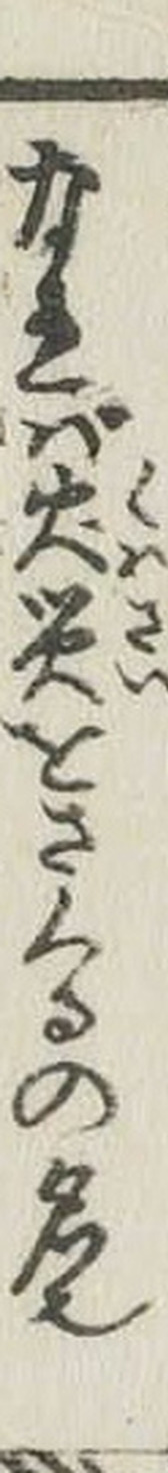なれば火災をさくるの名也
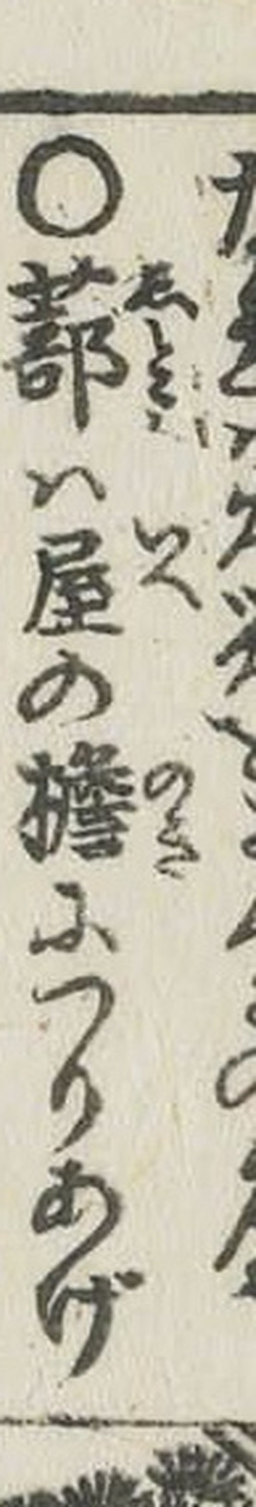○蔀は屋の檐につりあげ
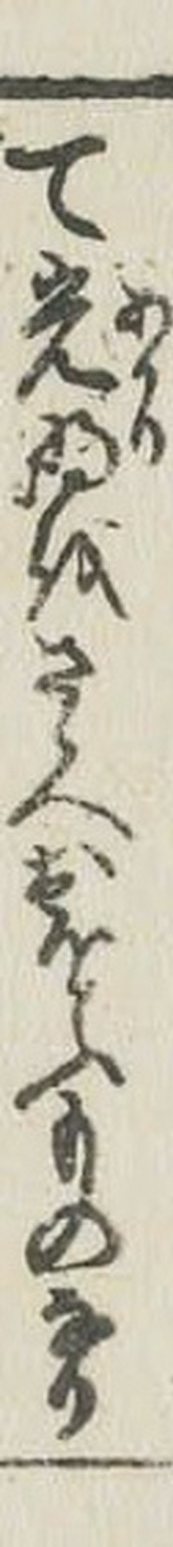て光明をさゝへおほふものなり
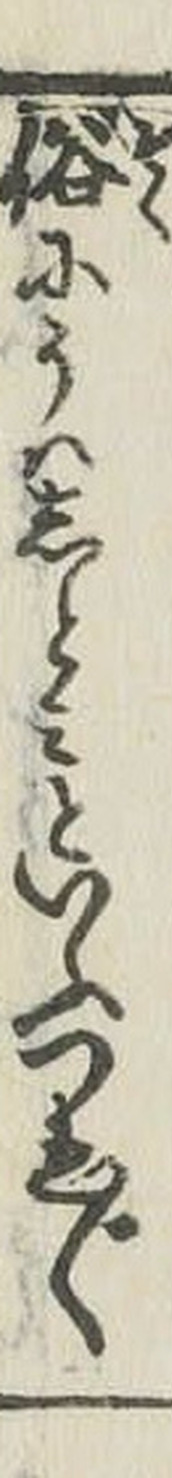俗にうはしとみといふつれ〴〵
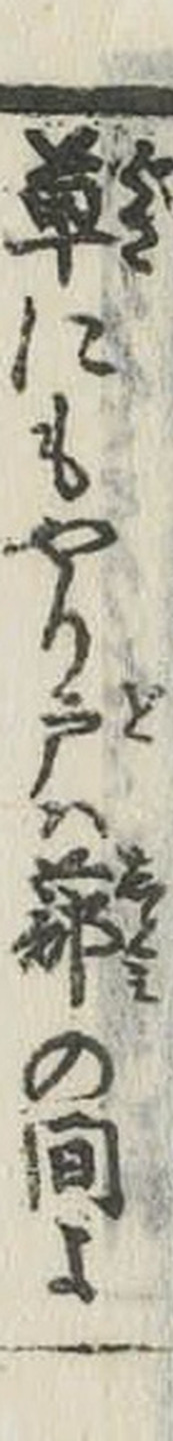草にもやり戸は蔀の間よ
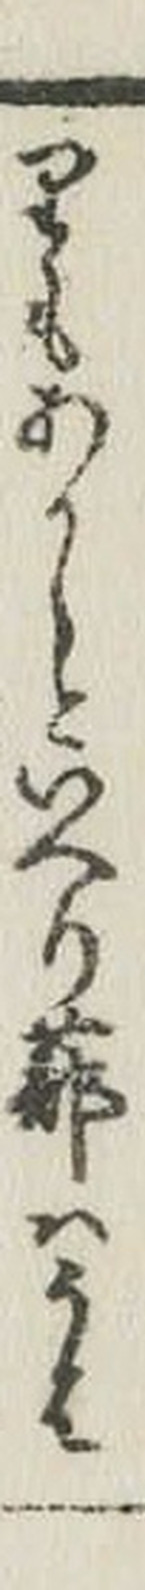りもあかしといへり蔀はうは
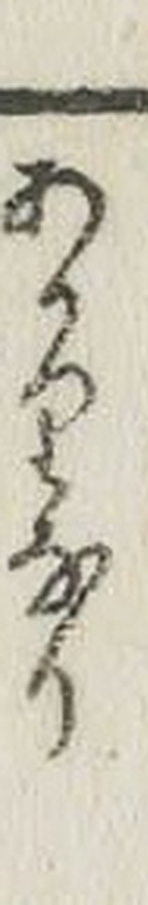あかりなり
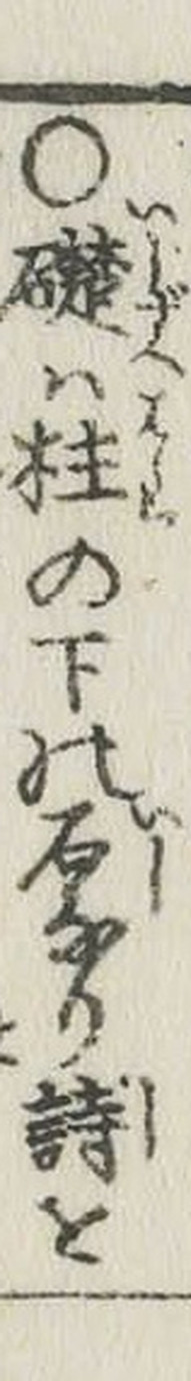○礎は柱の下の石なり詩を
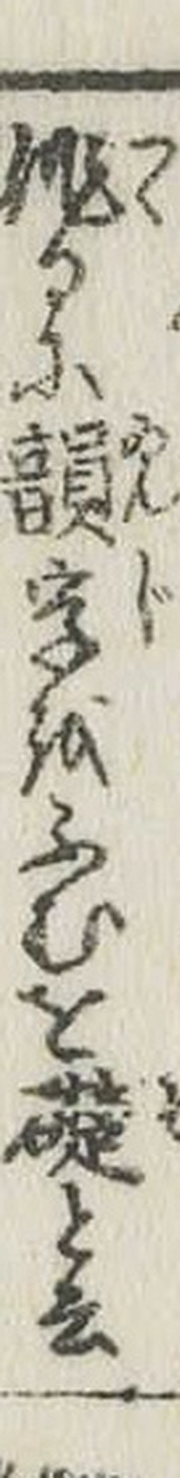作るに韻字をふむを礎と云
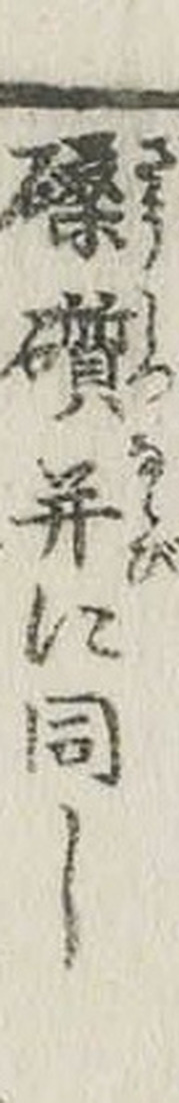磉礩并に同し
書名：増補頭書訓蒙図彙大成 10巻 2:巻之1-3
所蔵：東京学芸大学教育コンテンツアーカイブ
